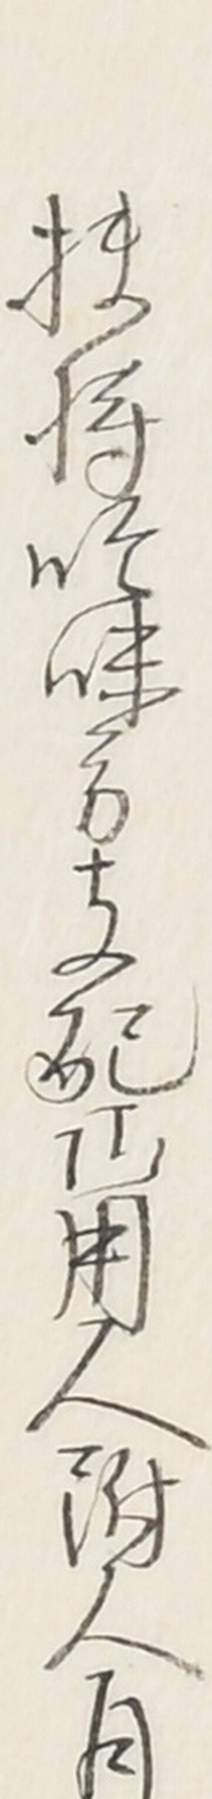扶持吟味方支配御用人附人月番詰
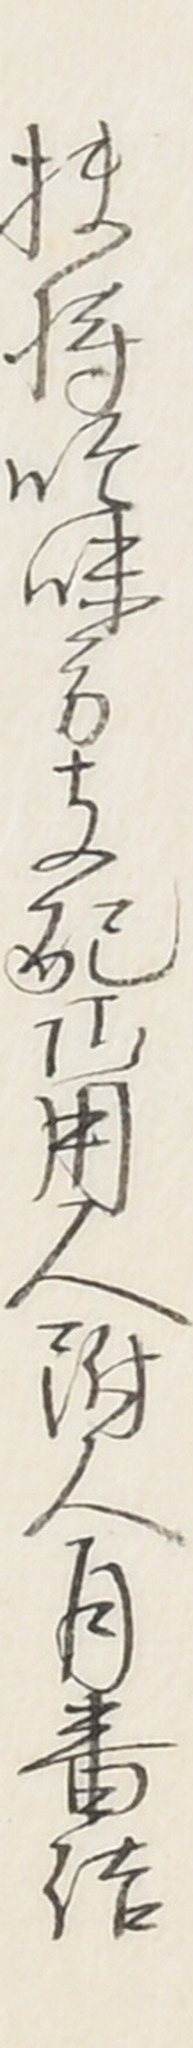扶持吟味方支配御用人附人月番詰
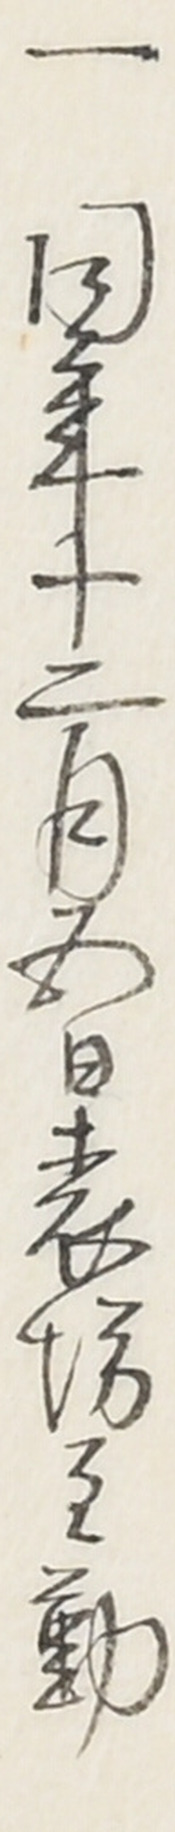一同年十二月五日表坊主勤
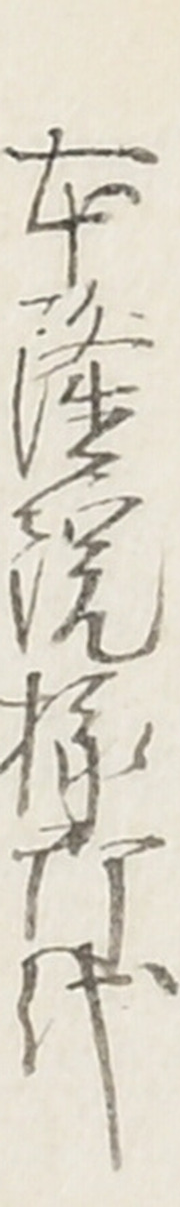本隆院様御代
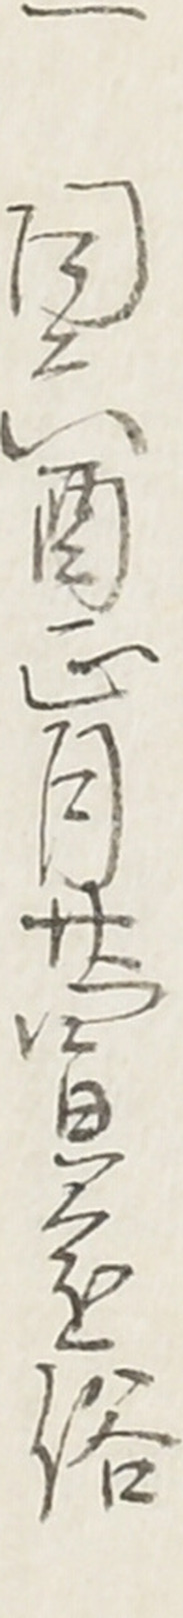一同六酉正月廿四日還俗
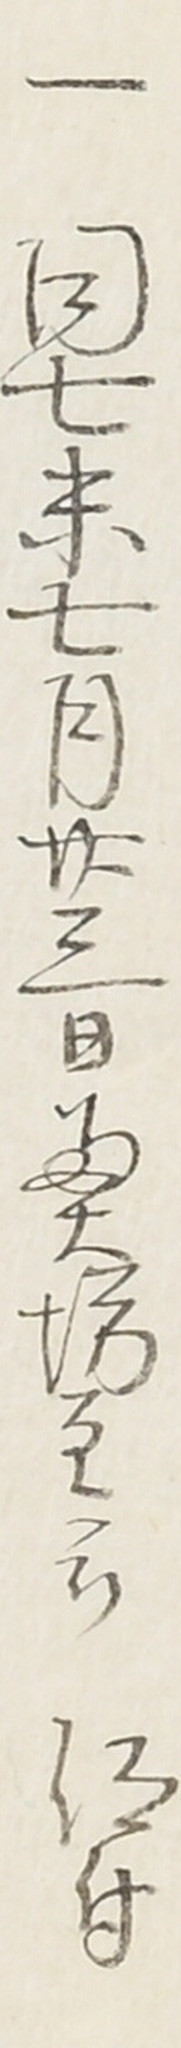一同七未七月廿三日奥坊主被仰付
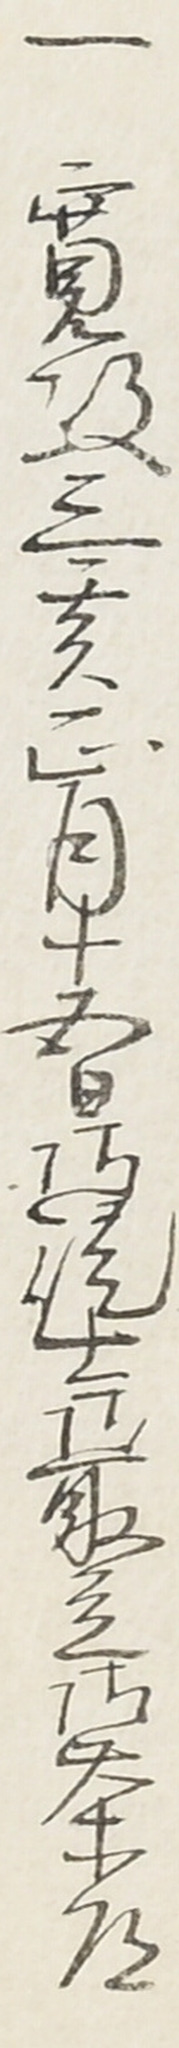一寛政三亥正月十五日御徒士御取立御茶道
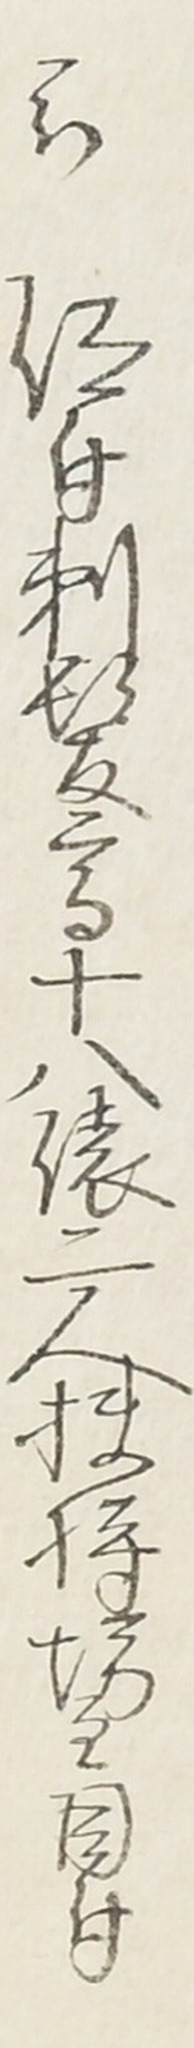被仰付剃髪高十八俵二人扶持坊主目付
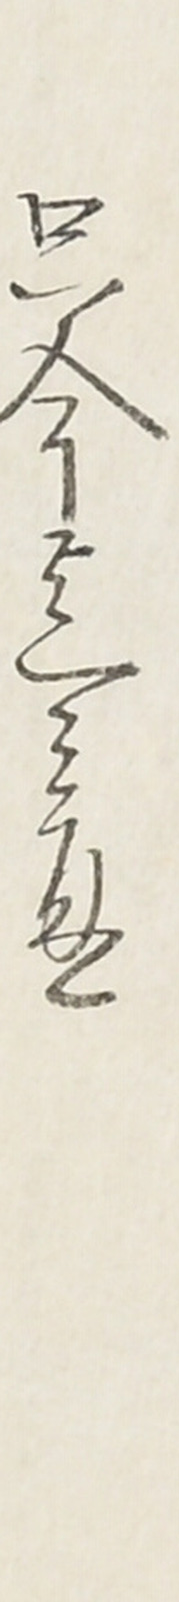只今迄之通
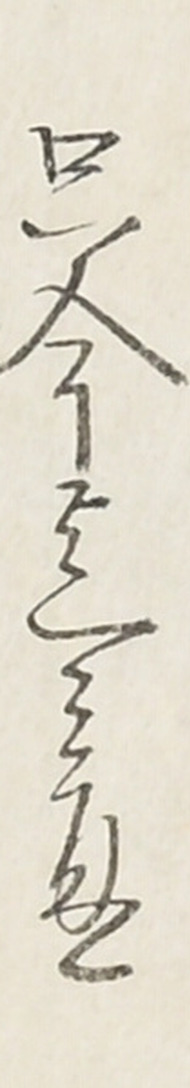只今迄之通
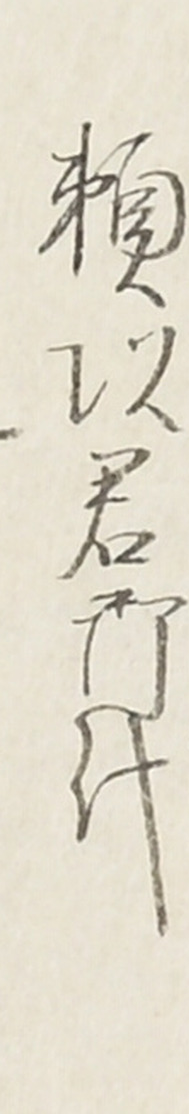頼以君御代
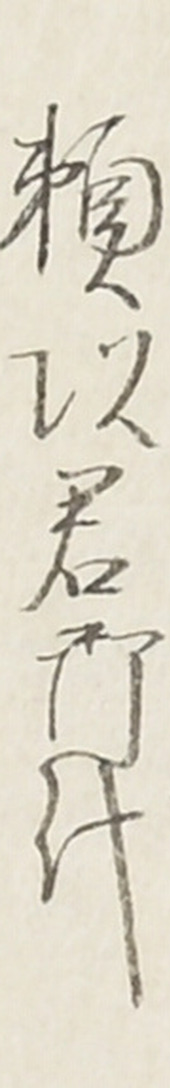頼以君御代
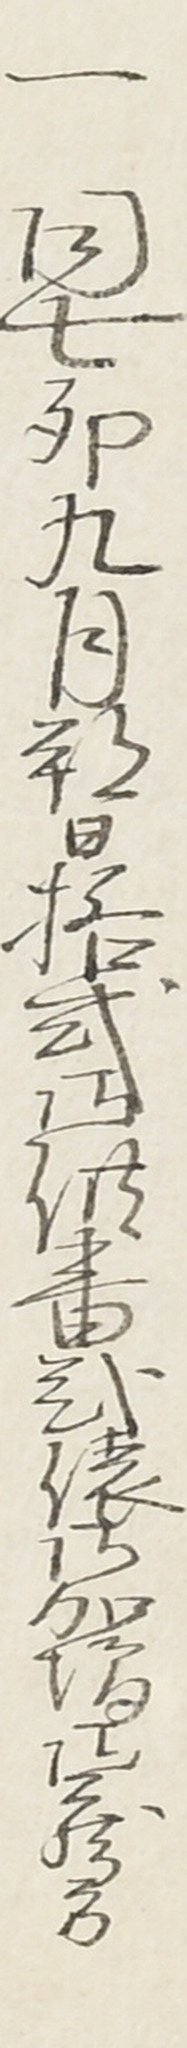一同七卯九月朔日格式御供番弐俵御加増御蔵方
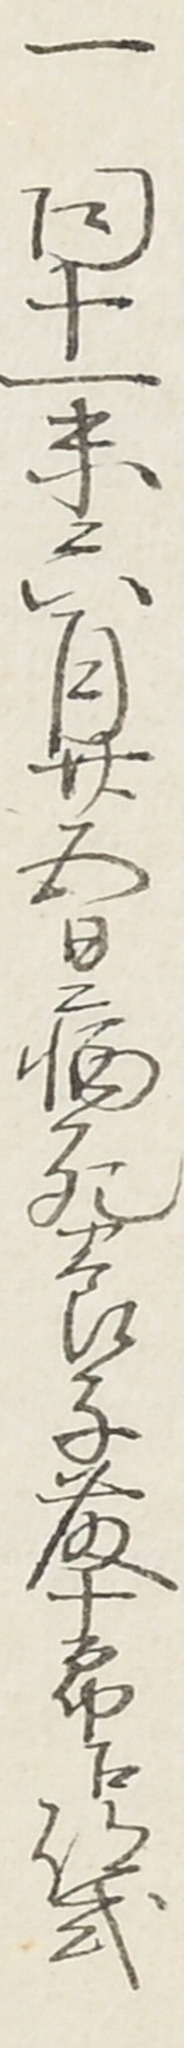一同十一未六月廿五日病死養子藤十郎江跡式
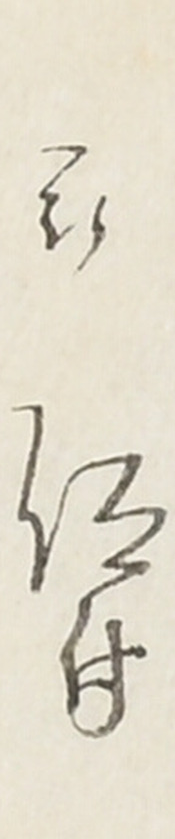被仰付

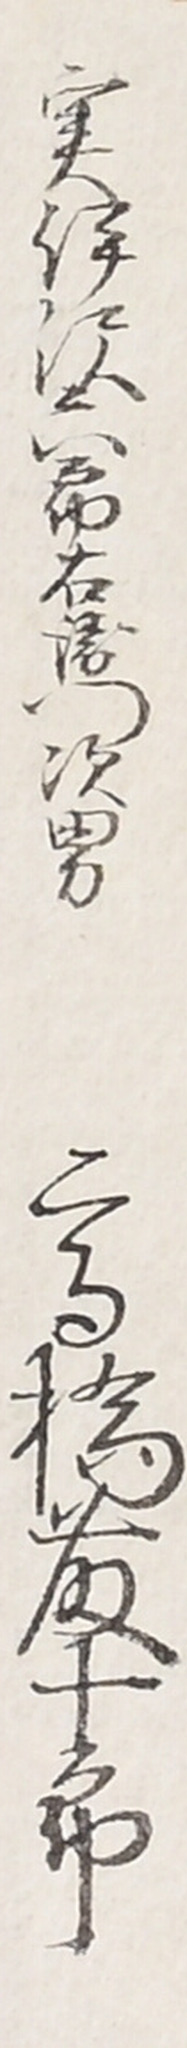実伊沢八郎右衛門次男高橋藤十郎
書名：無足諸士勤仕録（四）
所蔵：伊那市立高遠町図書館・合同会社AMANE
